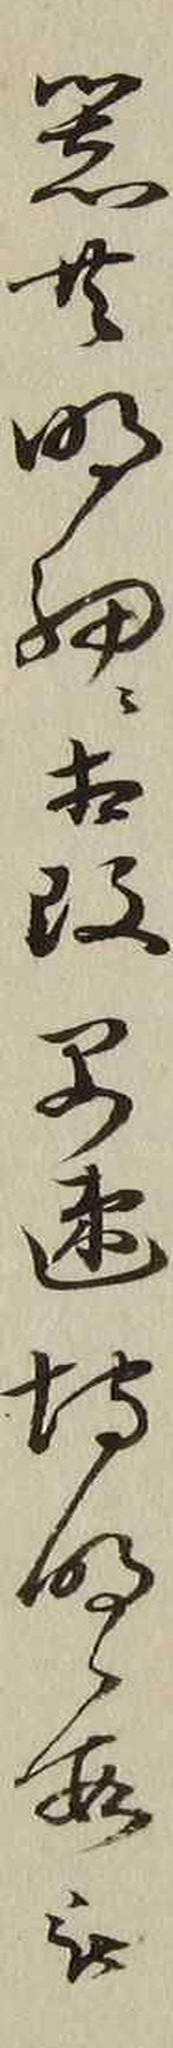器共明細相改早速埒明候段被
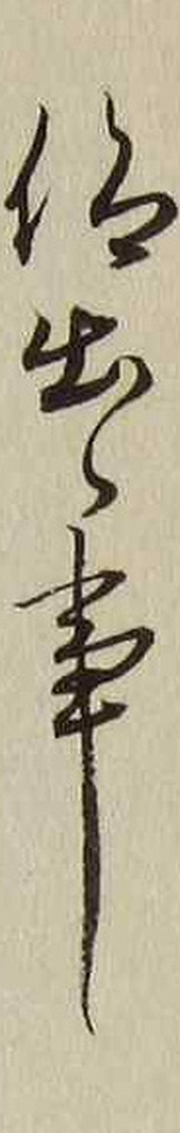仰出候事
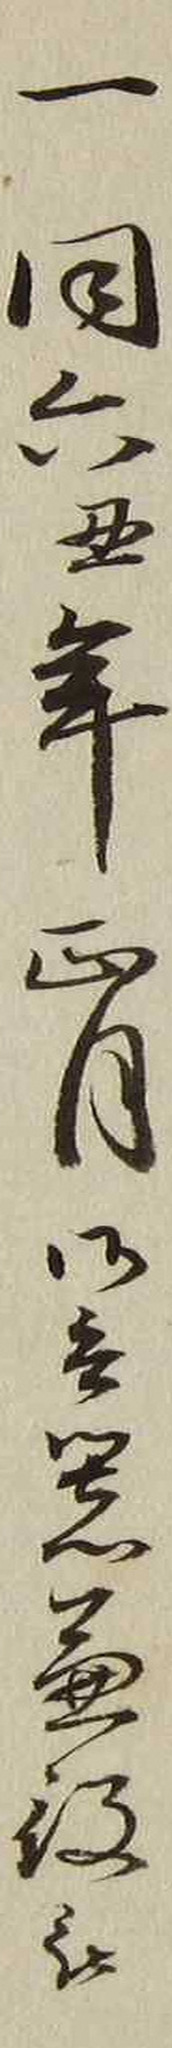一同六丑年正月御兵器兼役被
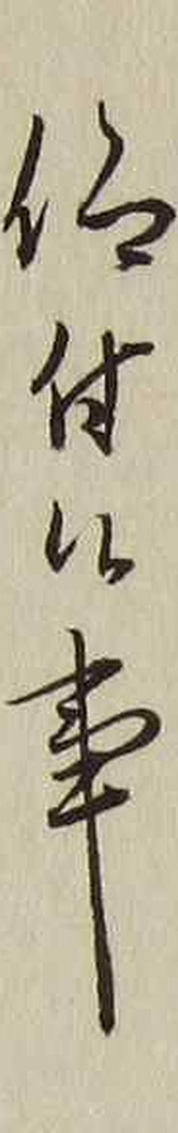仰付候事
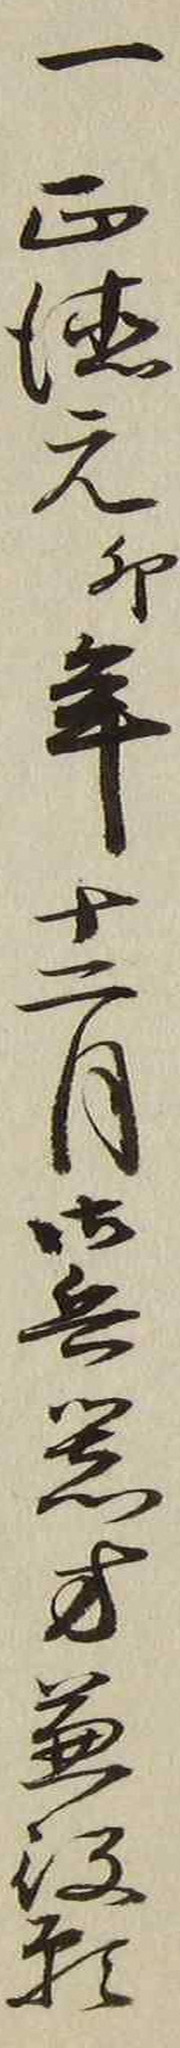一正徳元卯年十二月御兵器方兼役願
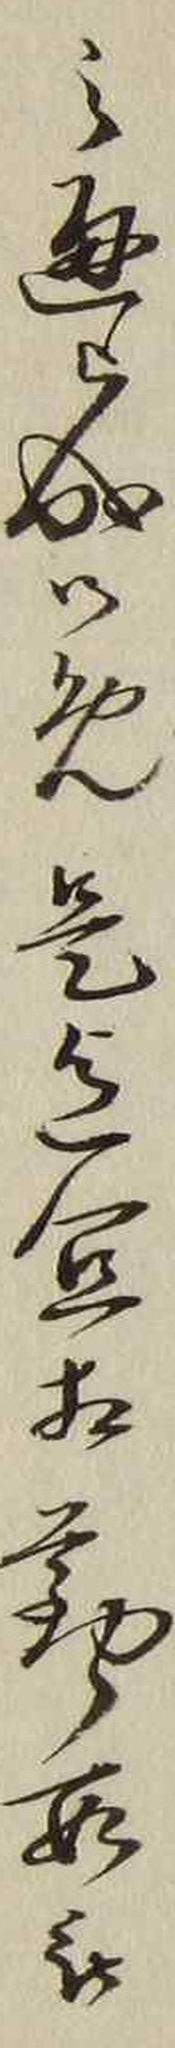之通被成御免是迄宜相勤候段被
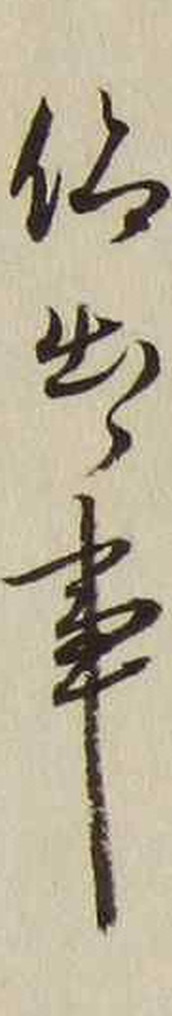仰出候事

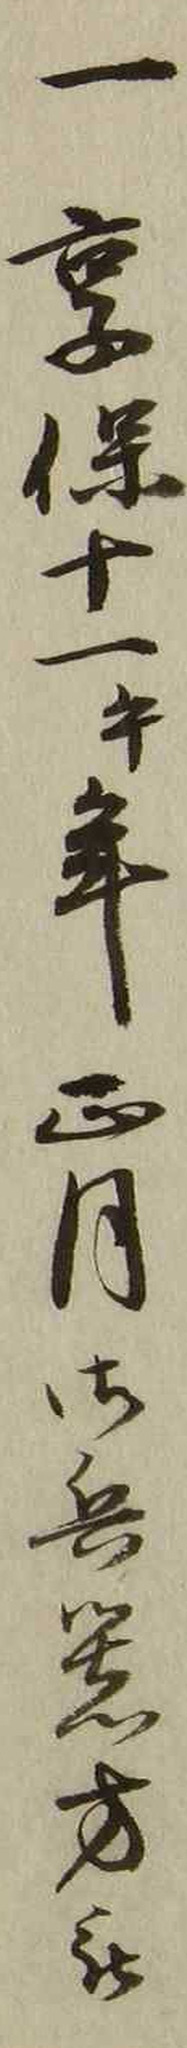一享保十一午正月御兵器方被
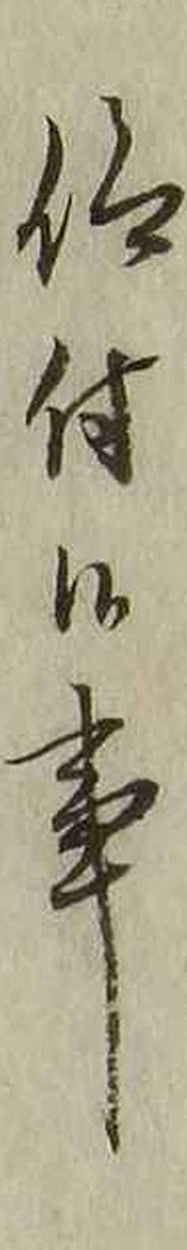仰付候事
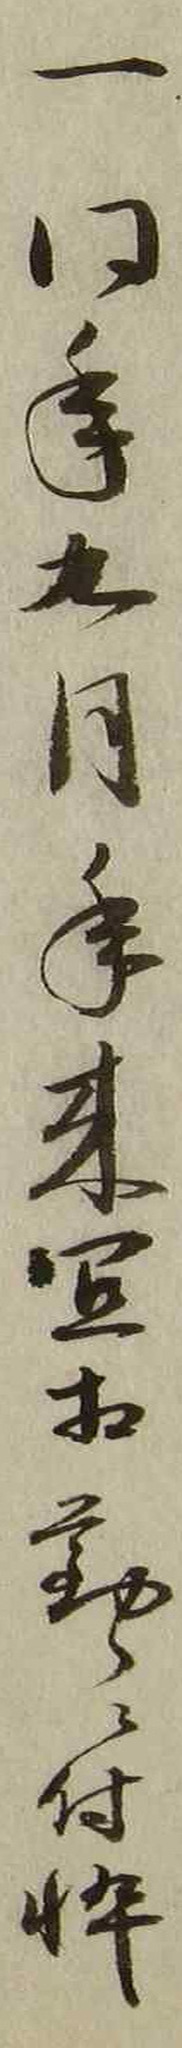一同年九月年来宜相勤候付忰
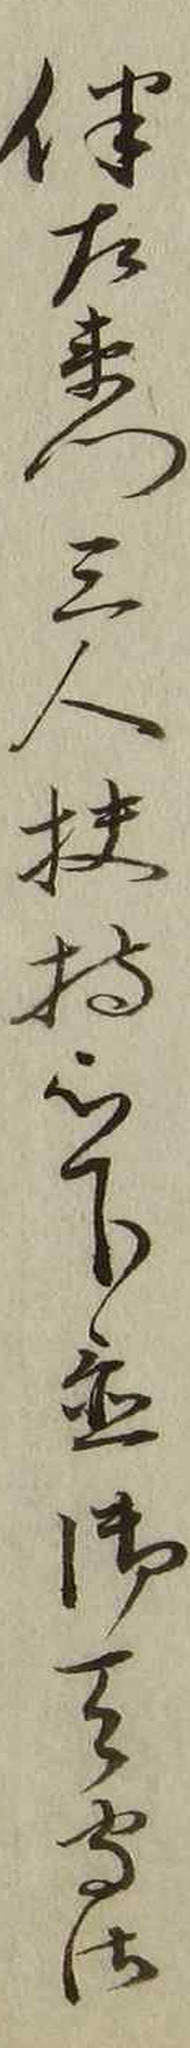伴左衛門三人扶持被下置御天守御
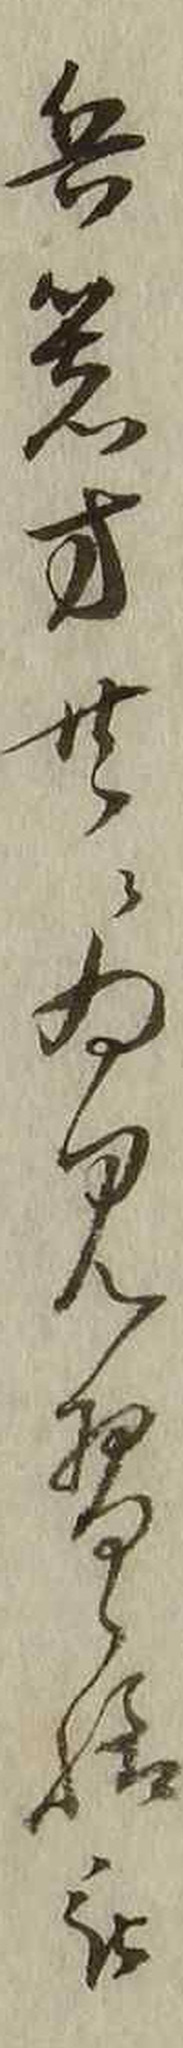兵器方共為見習候様被
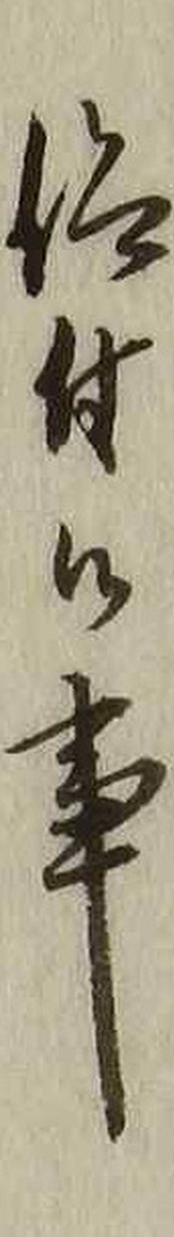仰付候事
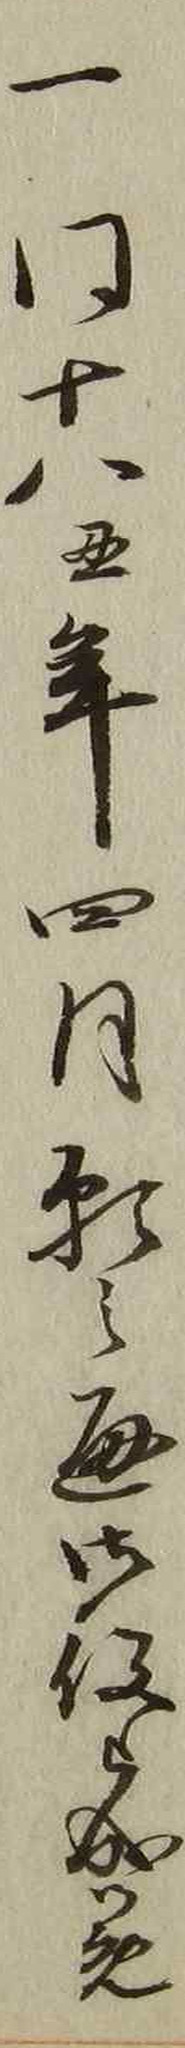一同十八丑年四月願之通御役被成御免
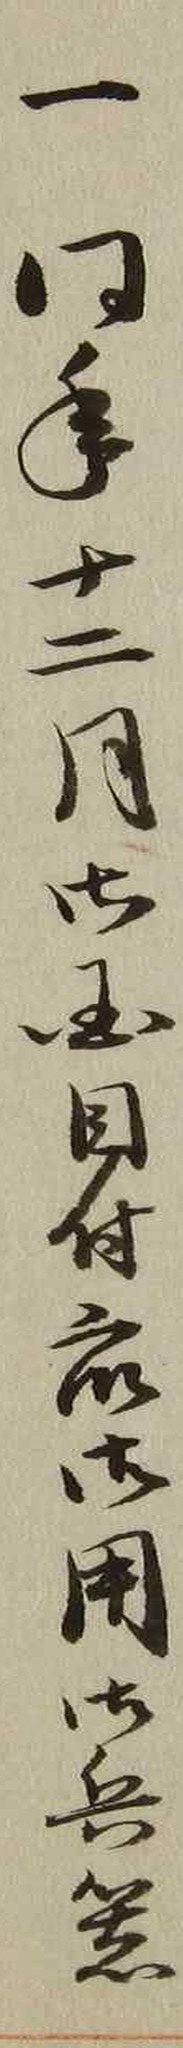一同年十二月御国目付衆御用御兵器
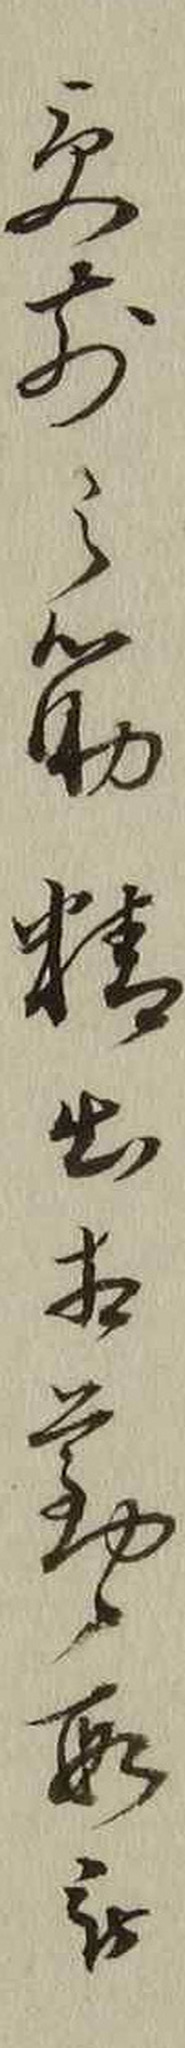受前之筋精出相勤候段被
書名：諸士系譜　巻之102　か之部10
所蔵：会津若松市立会津図書館
